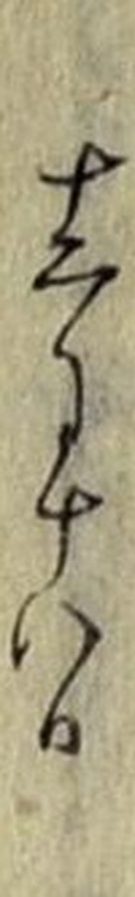十二月十八日
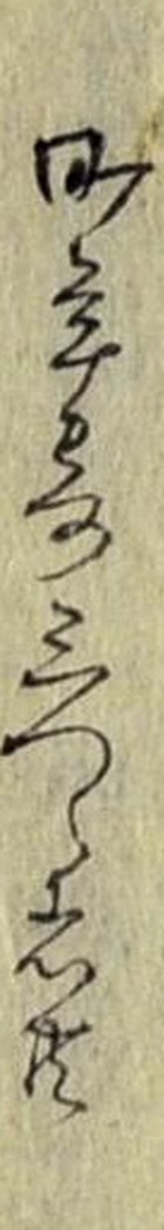町年寄三人之者共
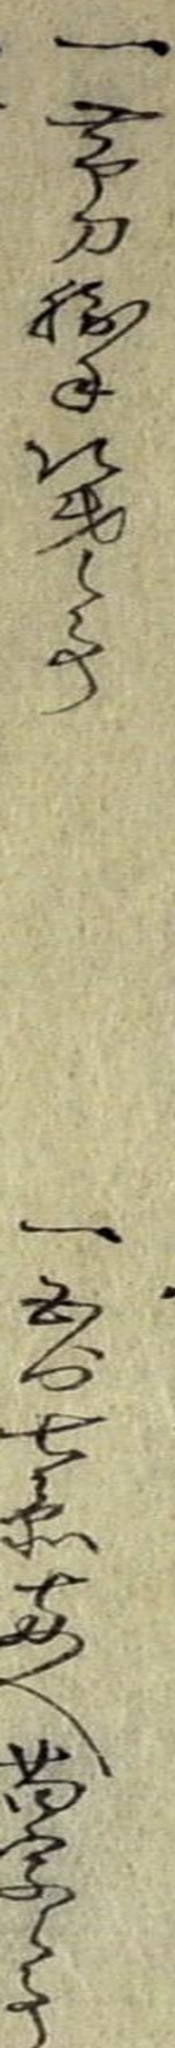一帯刀勝手次第之事一五右衛門七兵衛両人苗字之事
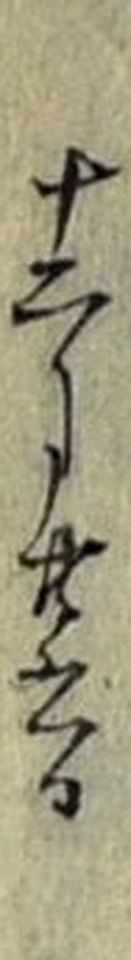十二月廿六日
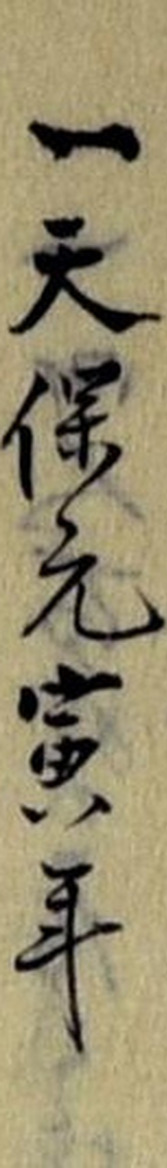一天保元寅年
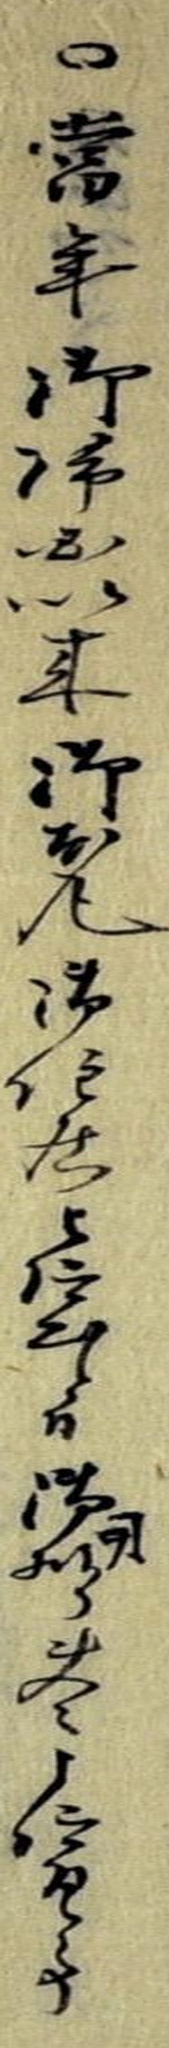○当年御帰国以来御本丸御住居被仰出候ニ付御用掛り夫々被仰付候
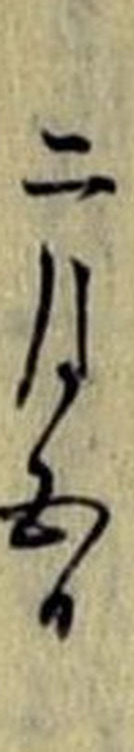二月五日
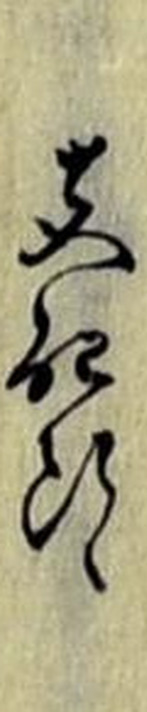支配頭へ
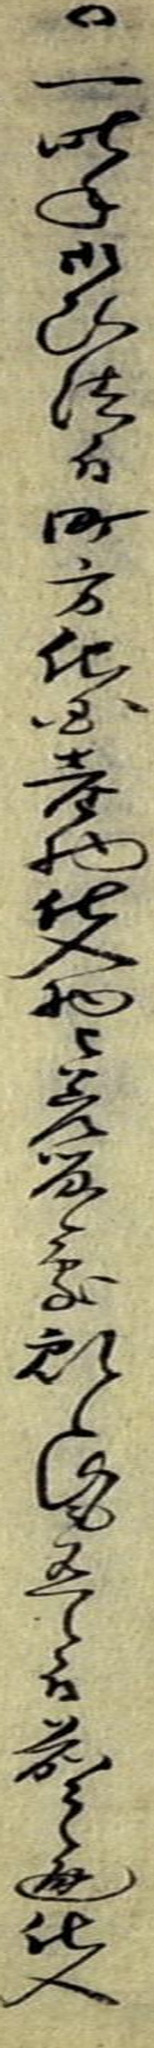○一昨年御趣法ニ付町方他国産物仕入物被差留候処願之趣有之ニ付前々之通仕入
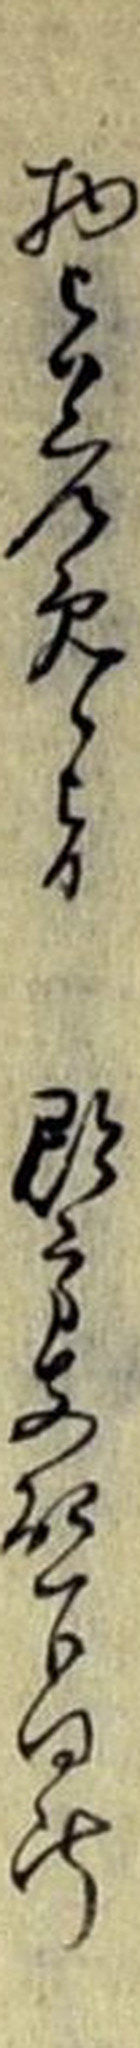物被差免候旨郡方支配下同断
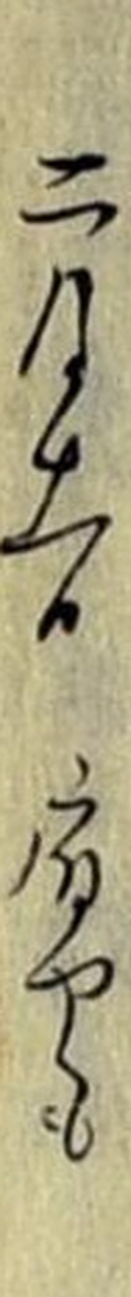二月十一日府中へも
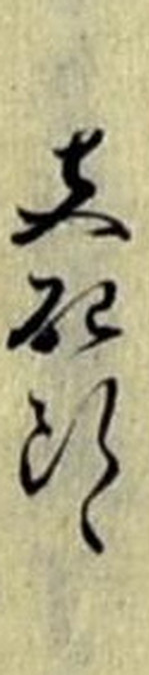支配頭へ
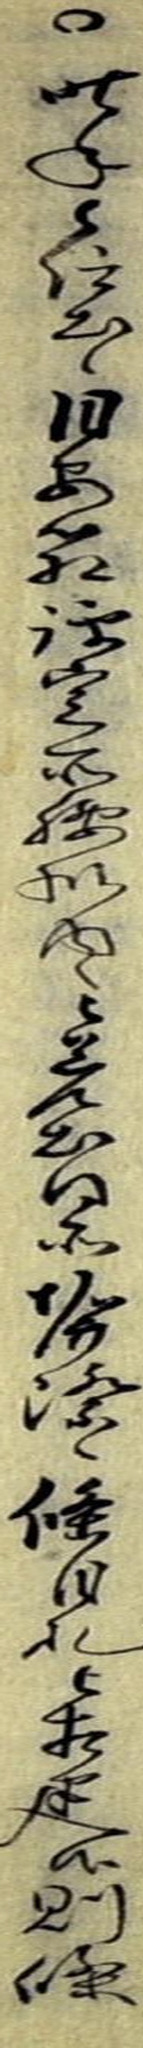○昨年被仰出候目安箱評定所腰掛内へ被差出同所塀際へ条目札被相建候則条
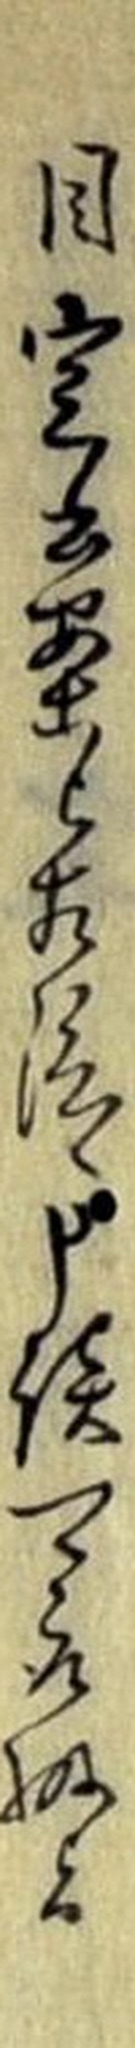目定書案被相渡候申談可取扱旨

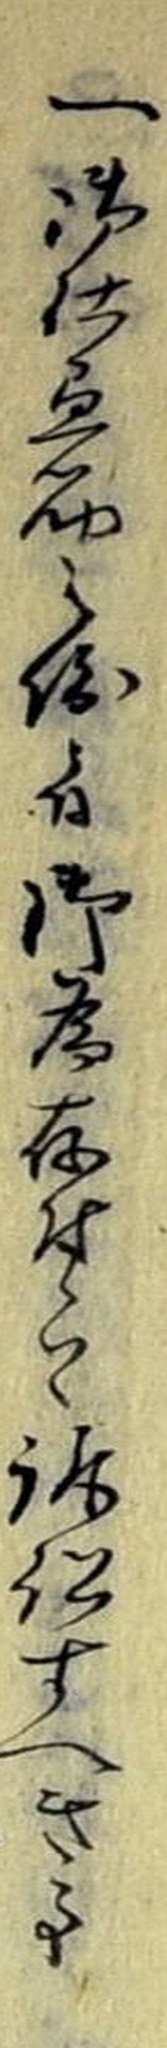一御仕置筋之儀ニ付御為存付候ハヽ訴訟すへき事
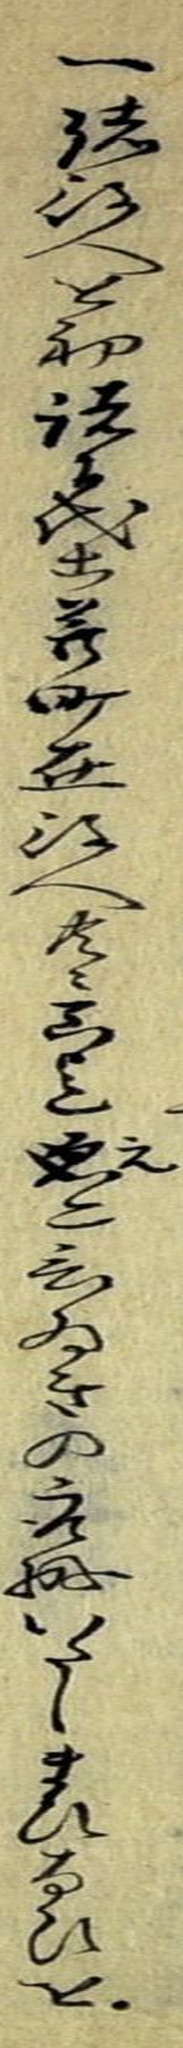一諸役人を初詰下代等并町在役人共ニ至迄ゑえこひゐきの取扱いたしまひるひを
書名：命令之部 五
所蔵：福井県文書館 Fukui Prefectural Archives
